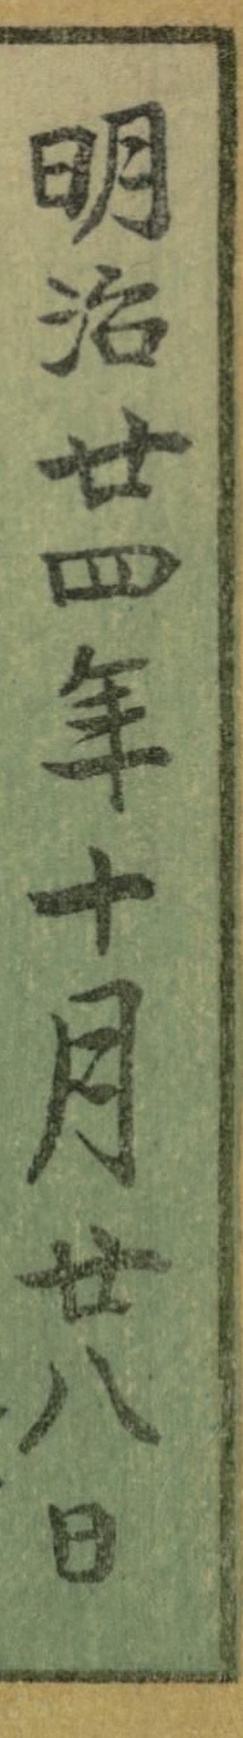明治廿四年十月廿八日
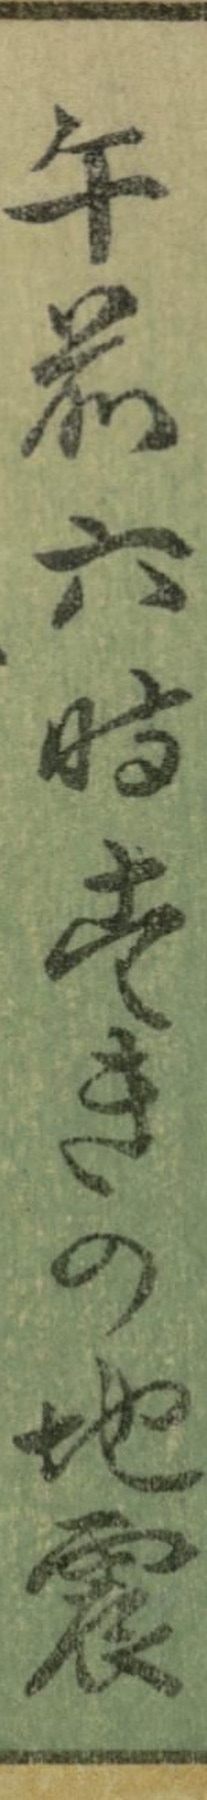午前六時すきの地震
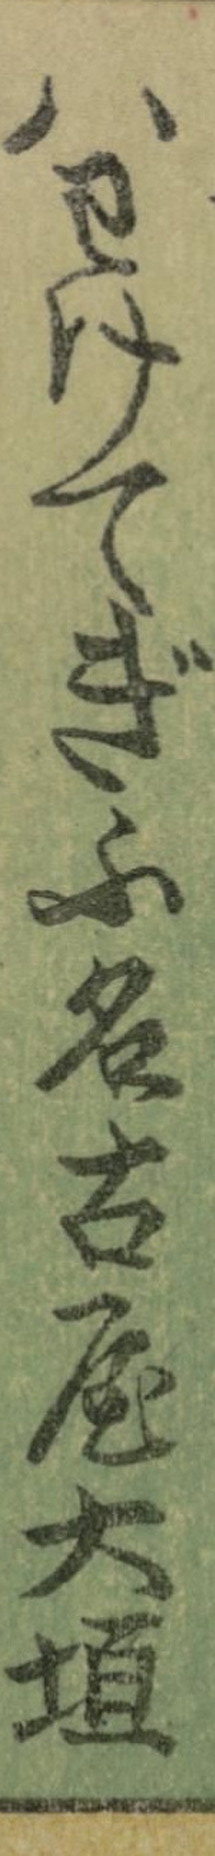はわけてぎふ名古屋大垣
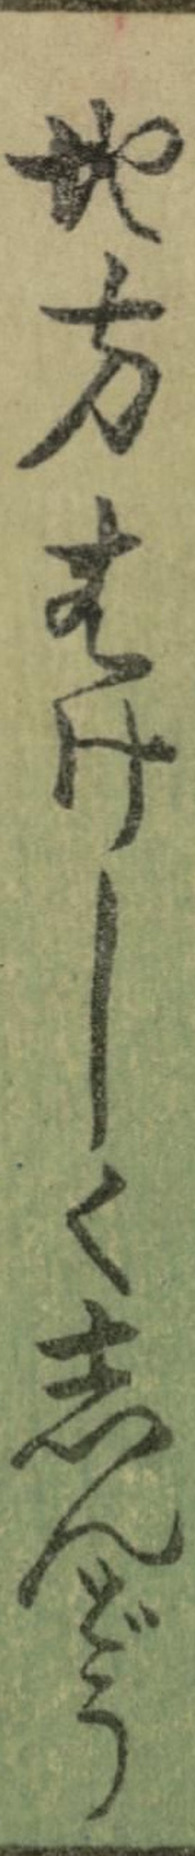地方はけしくしんどう
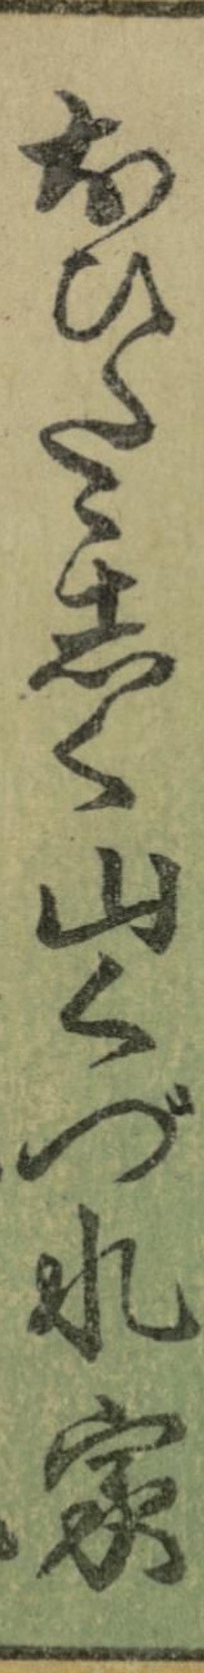おひたゝしく山くづれ家
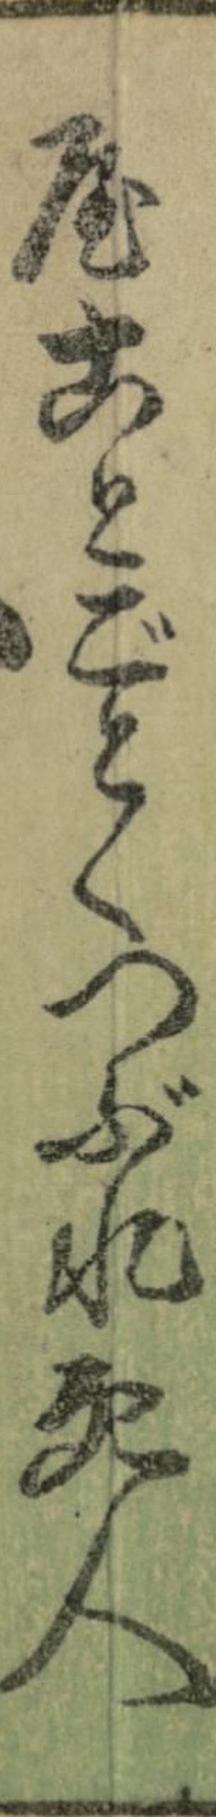屋ことごとくつぶれ死人
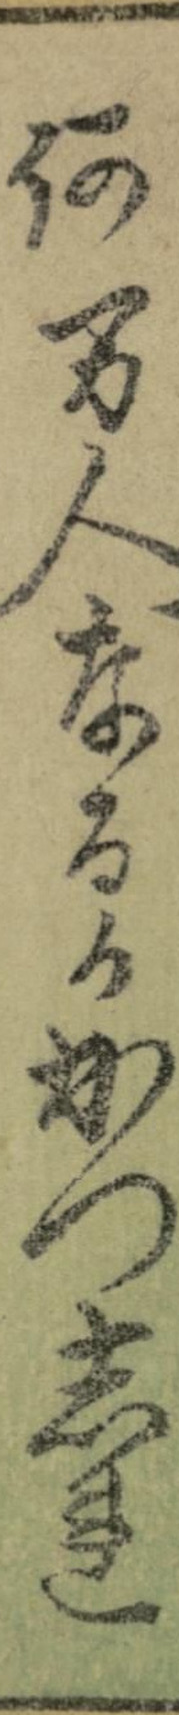何万人なるかかつしれ
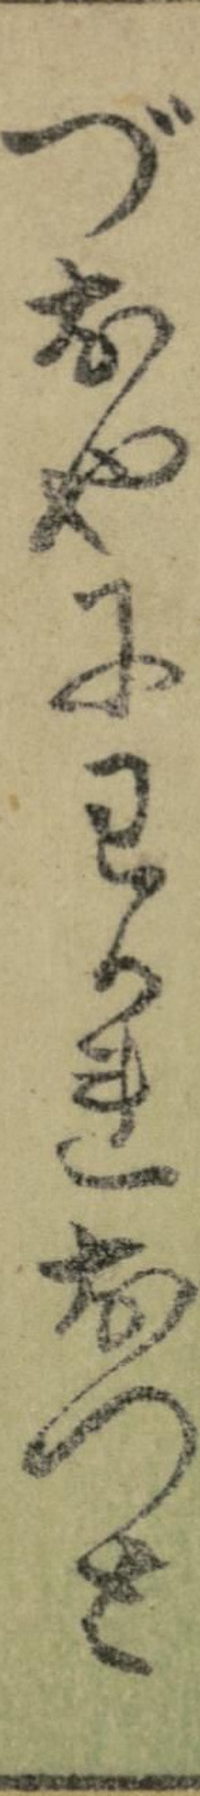づおやにわかれおつと
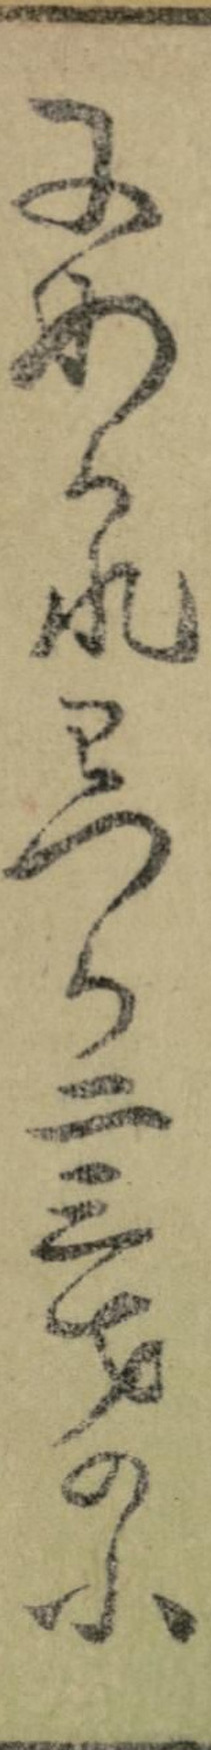にわかれわつか二三才の小
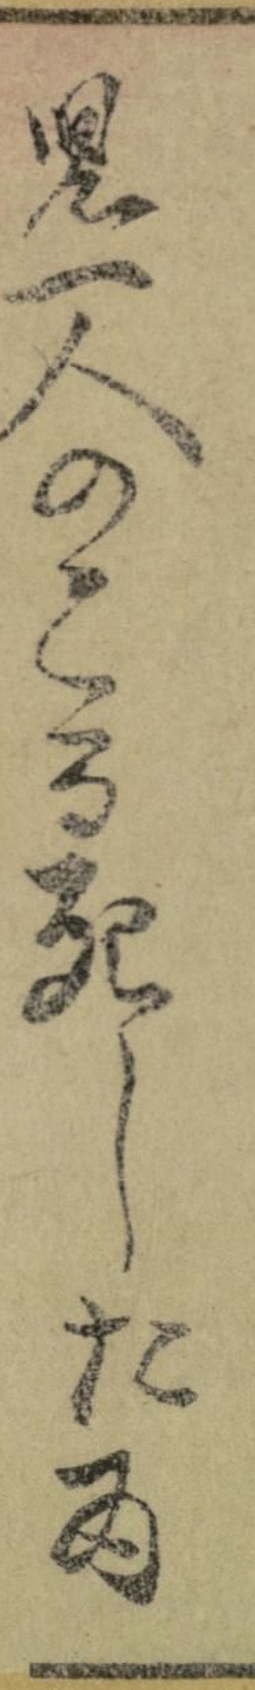児一人のこる死したる
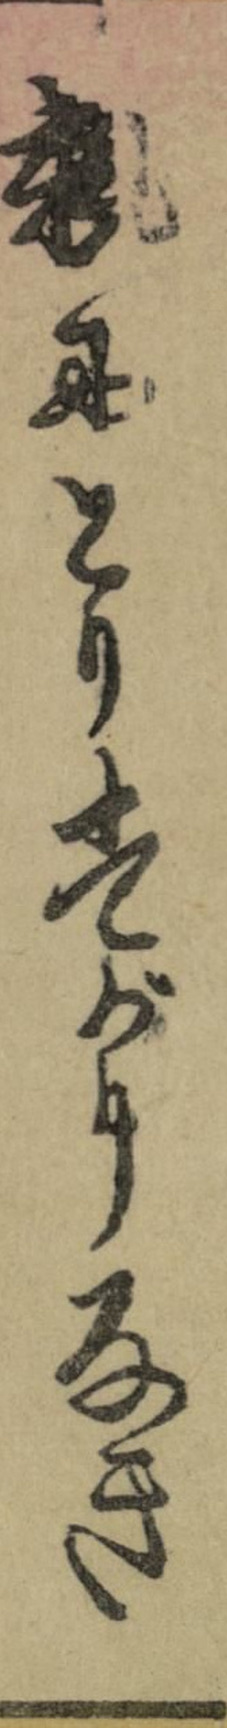親にとりすがりなき
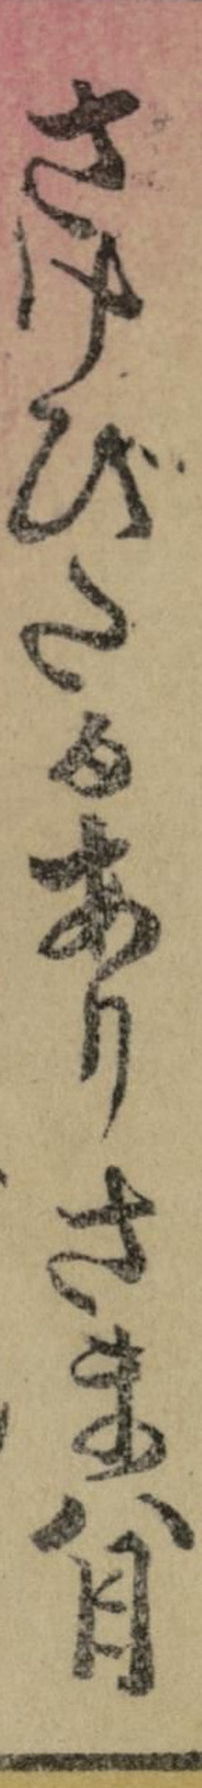さけびたるありさまは目
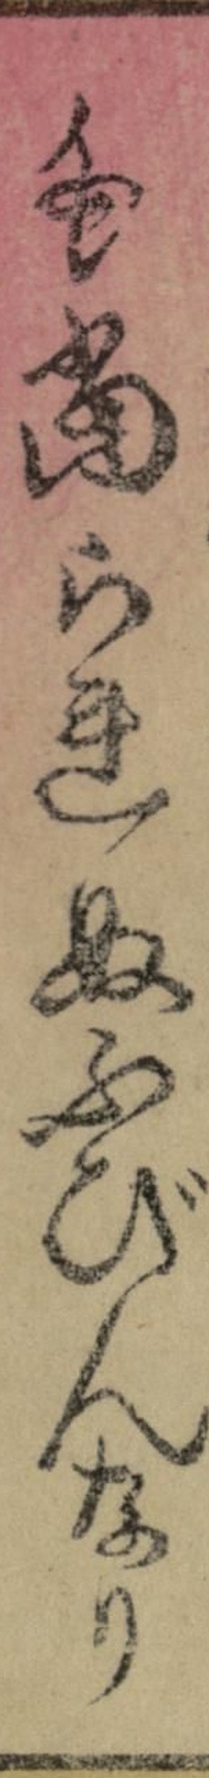も当られぬふびんなり
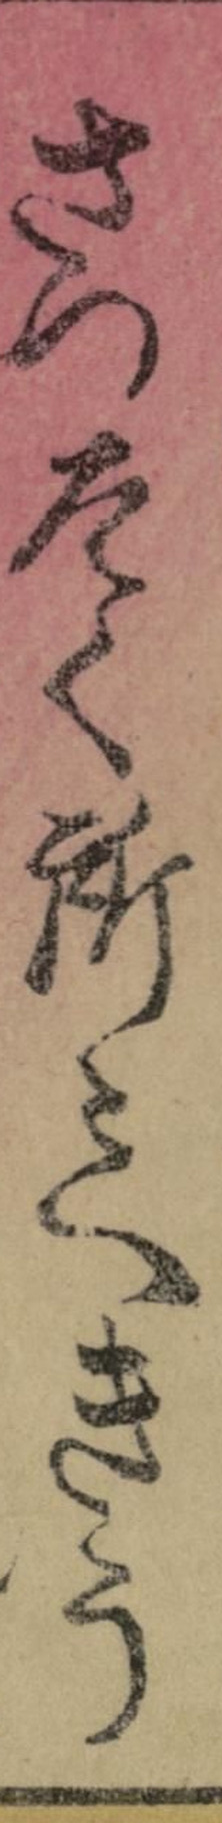さつそく所々へきう
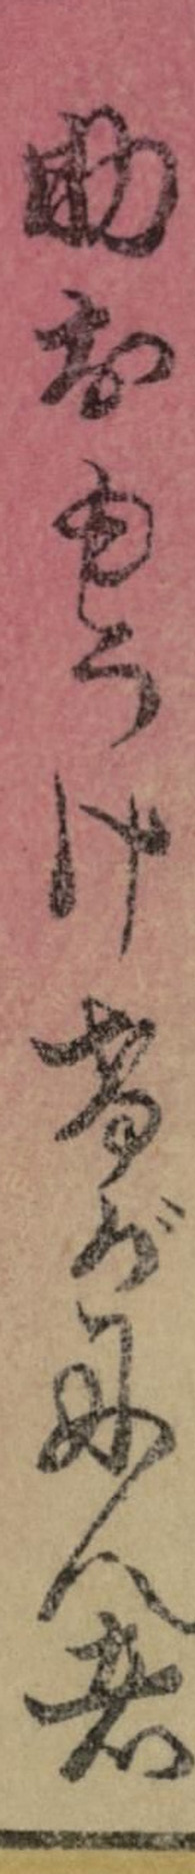助おもうけけがにんは
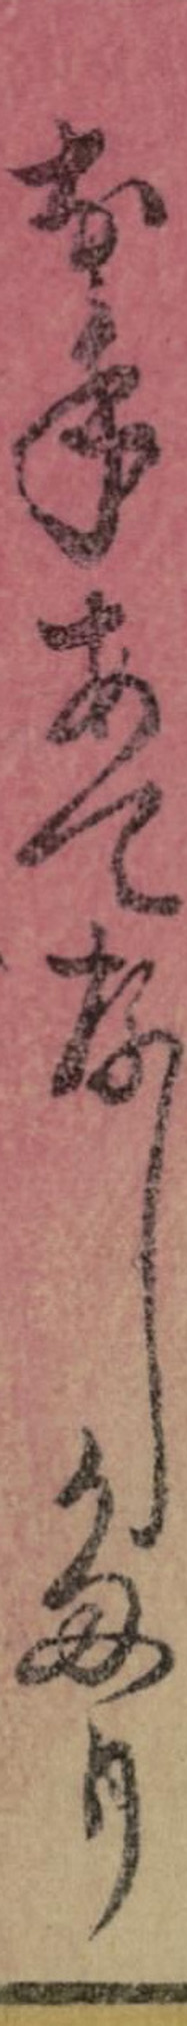お手あてなしたり
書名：明治廿四年十月廿八日　大地震後圖
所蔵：東京大学地震研究所図書室 Earthquake Research Institute Library, The University of Tokyo, JAPAN
